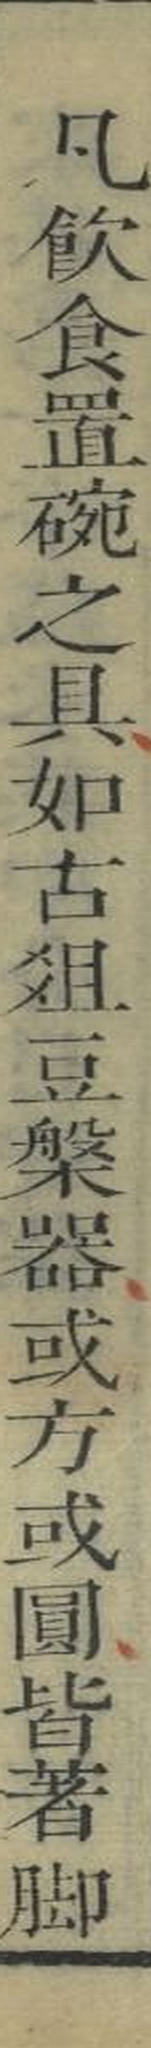凡飲食置碗之具如古俎豆槃器或方或円皆著脚
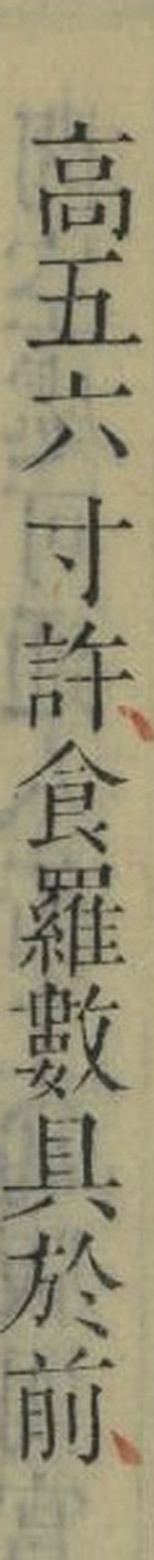高五六寸許食羅数具於前
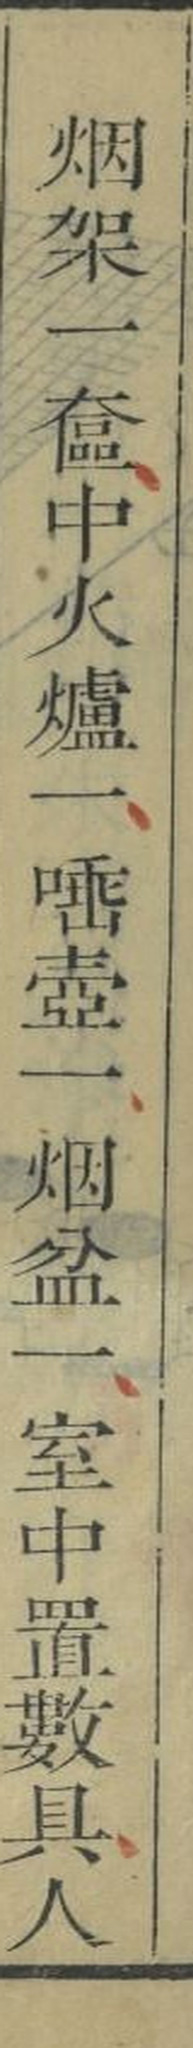煙架一奩中火炉一唾壺一煙盆一室中置数具人

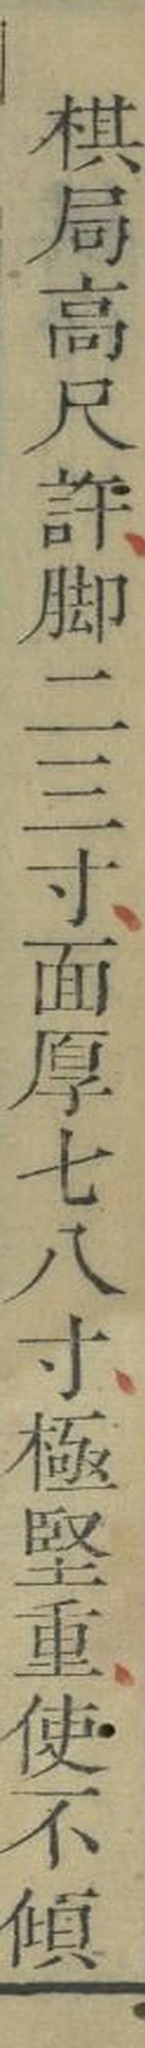棋局高尺許脚二三寸面厚七八寸極堅重使不傾
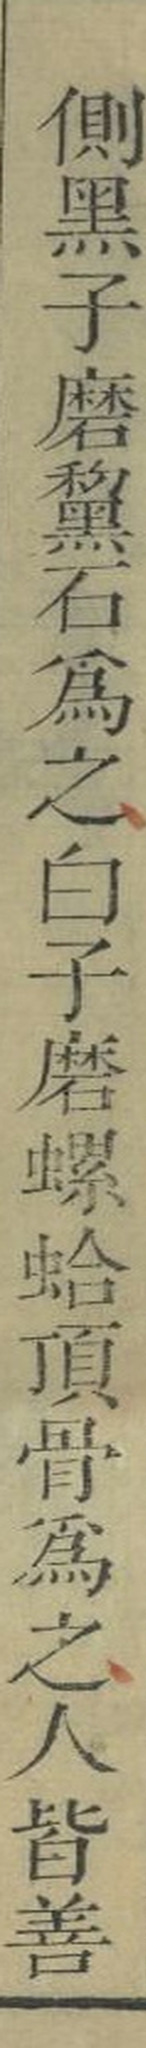側黒子磨黧石為之白子磨螺蛤頂骨為之人皆善
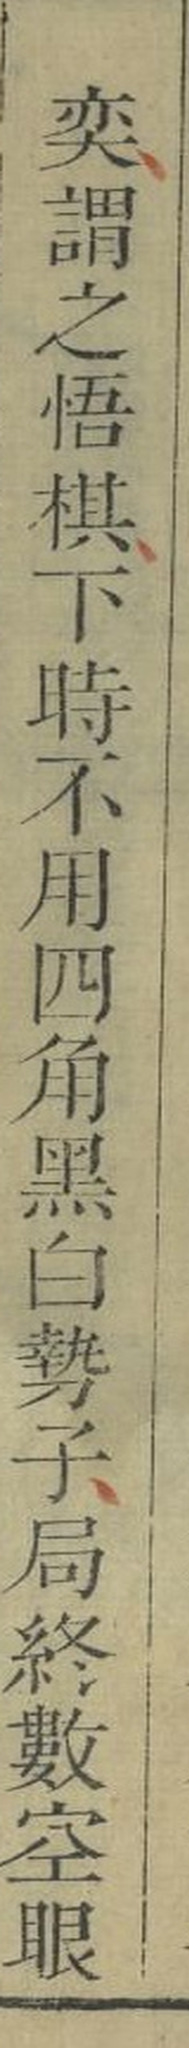奕謂之悟棋下時不用四角黒白勢子局終数空眼
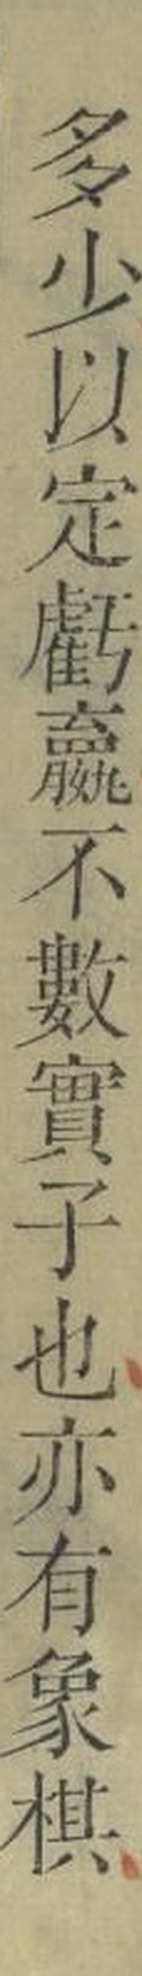多少以定虧嬴不数実子也亦有象棋
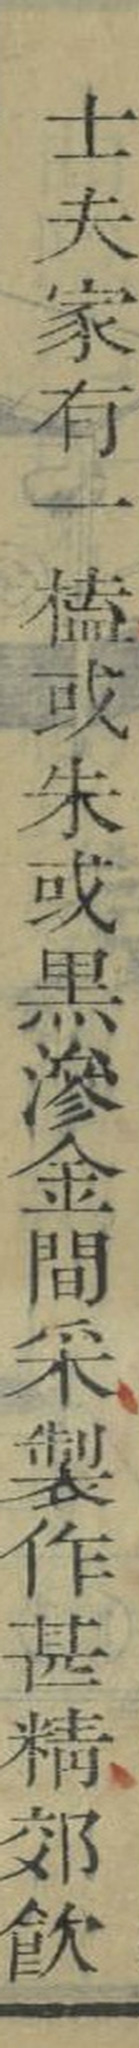士夫家有一榼或朱或黒滲金間采製作甚精郊飲
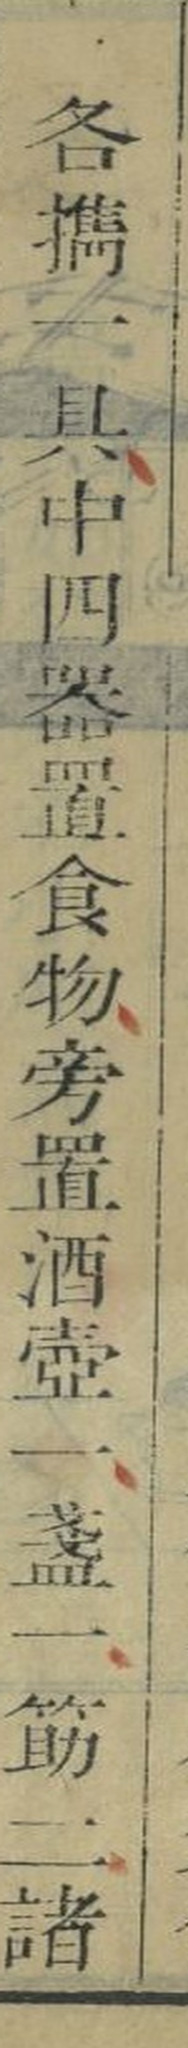各携一具中四器置食物旁置酒壺一盞一筯二諸
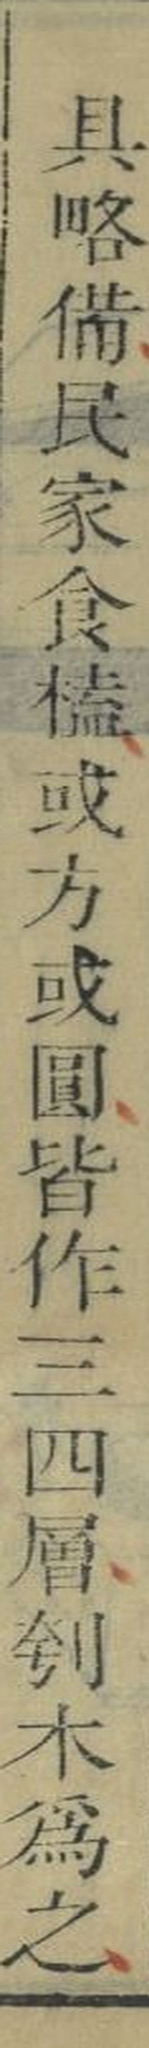具略備民家食榼或方或円皆作三四層刳木為之

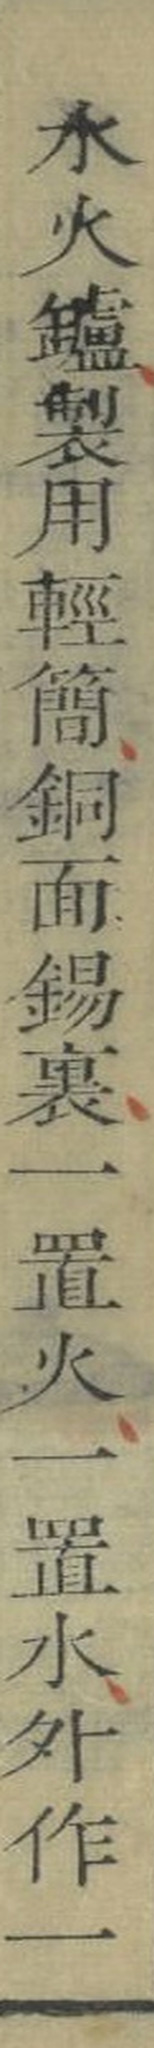水火罏製用軽簡銅面錫裏一置火一置水外作一
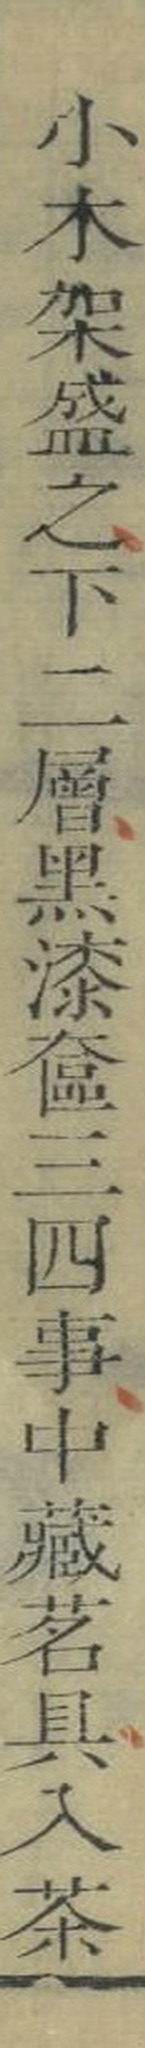小木架盛之下二層黒漆奩三四事中蔵茗具入茶
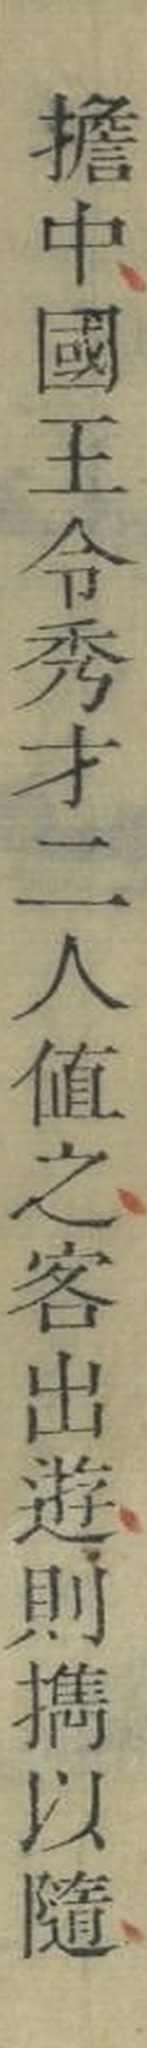担中国王令秀才二人値之客出遊則携以随
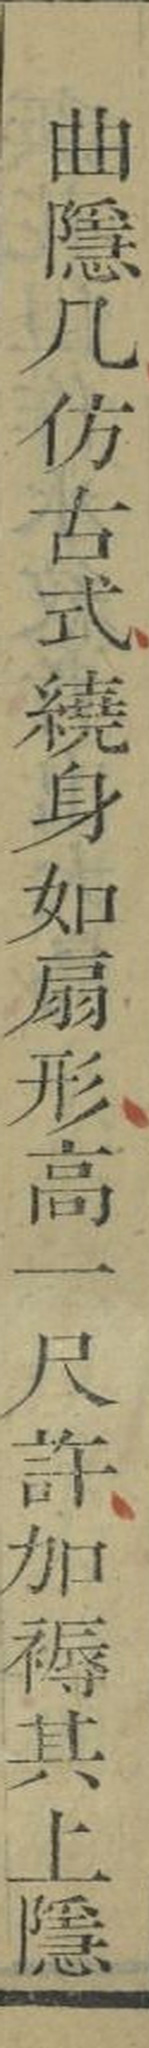曲隠几仿古式繞身如扇形高一尺許加褥其上隠
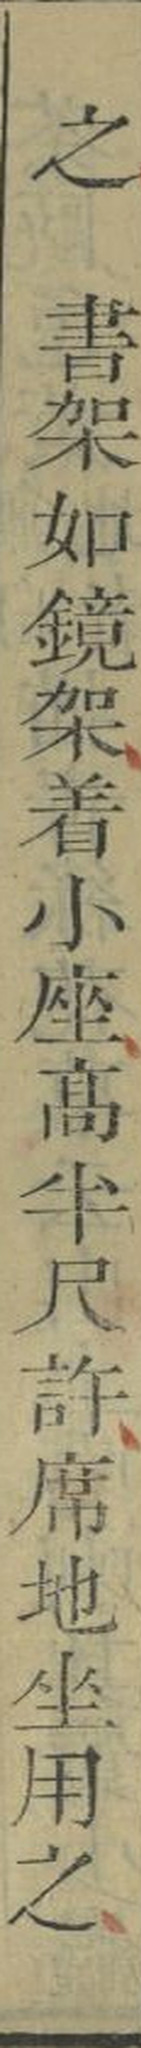之書架如鏡架着小座高半尺許席地坐用之

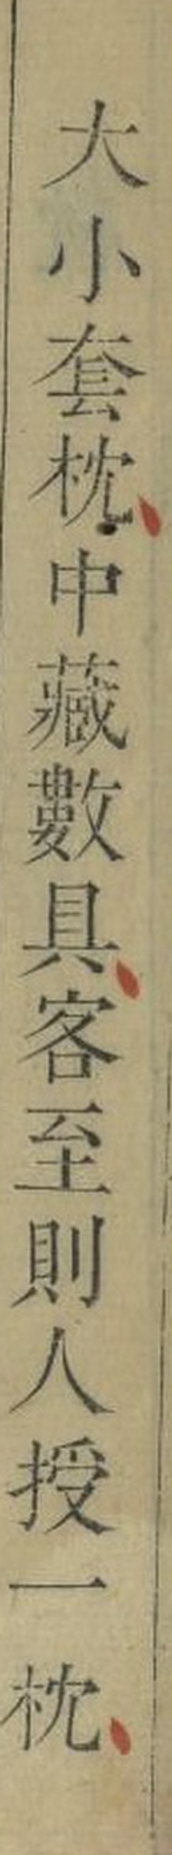大小套枕中蔵数具客至則人授一枕
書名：中山伝信録 巻六
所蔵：University of the Ryukyus Library
